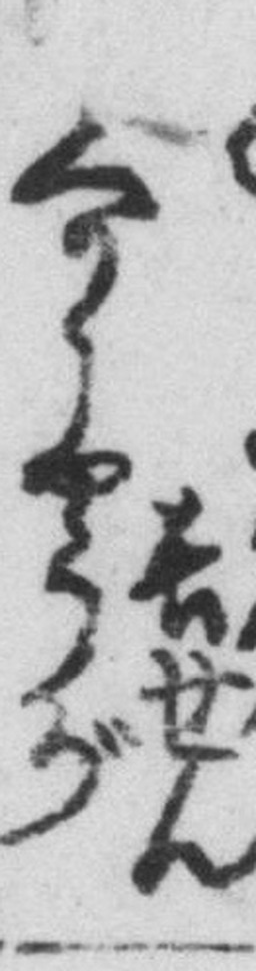くりしやうが
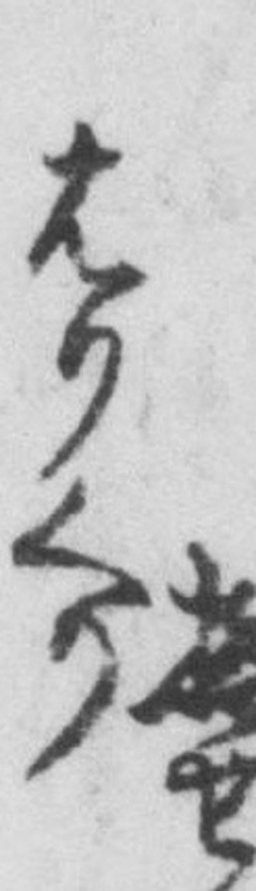はりくり
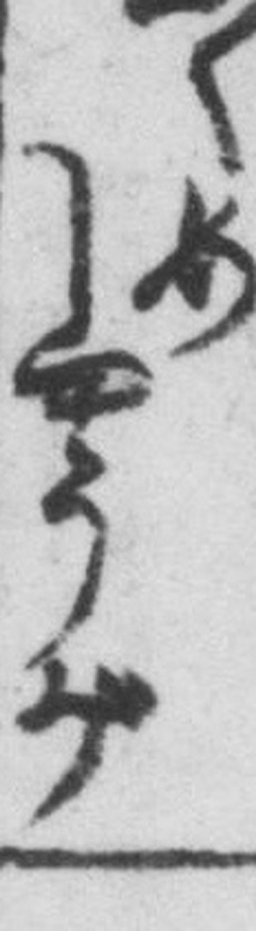しやうが
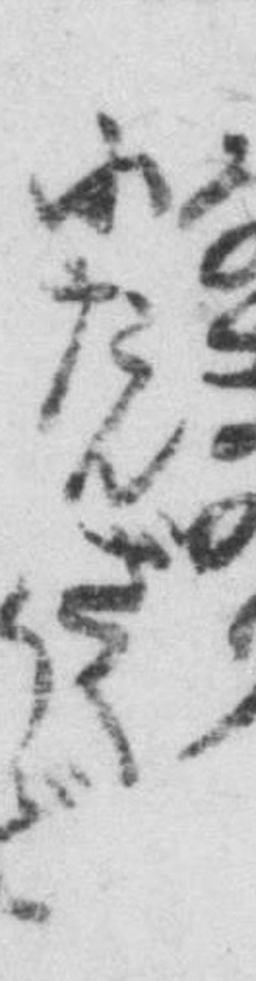小たんざくたう
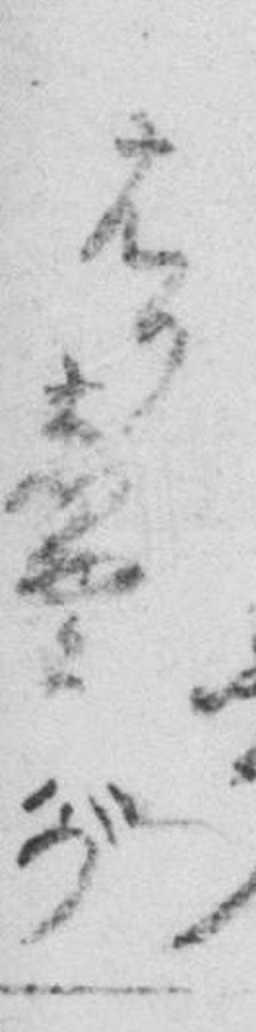くりしやうが
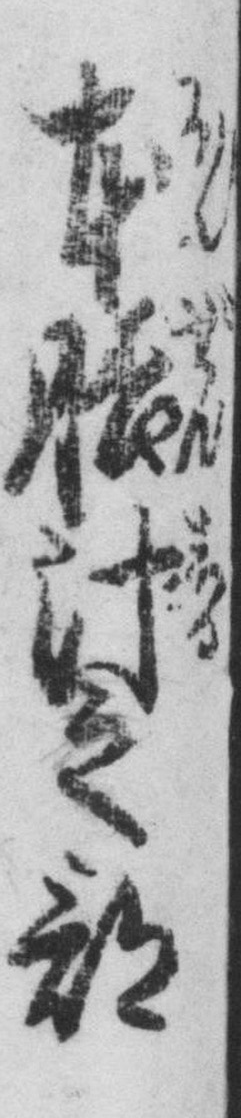本膳汁之部
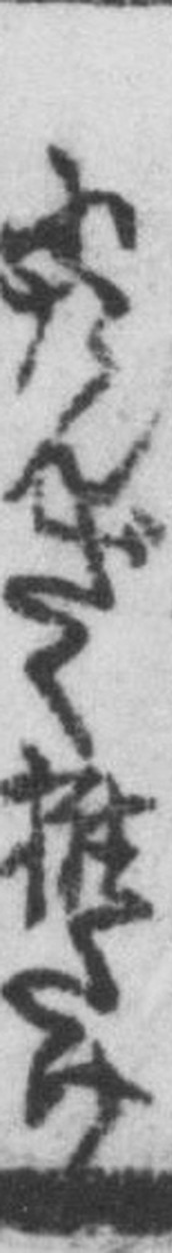小たんざくたう
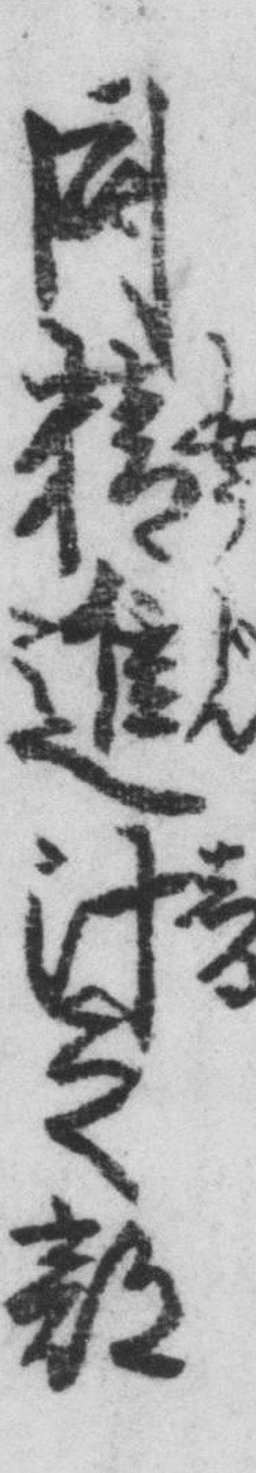同精進汁之部
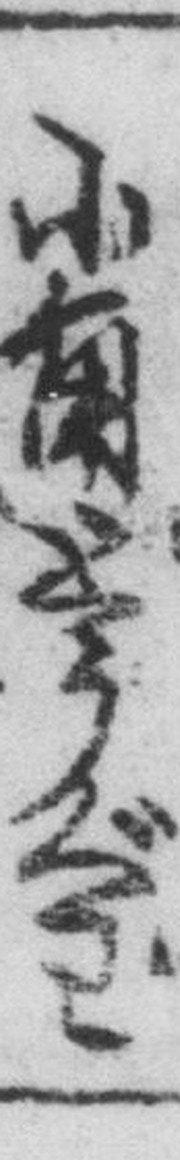小角とうぐわ
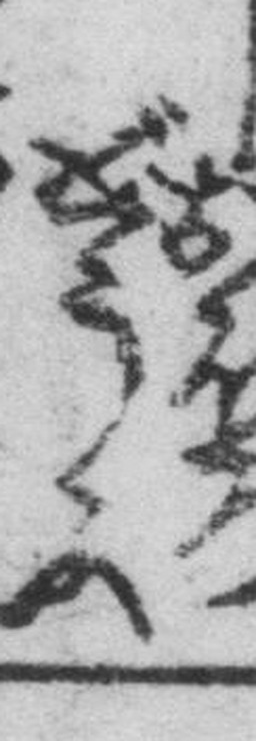どうふ
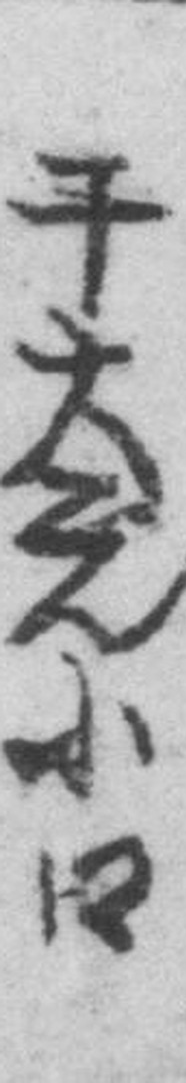干大こん小口

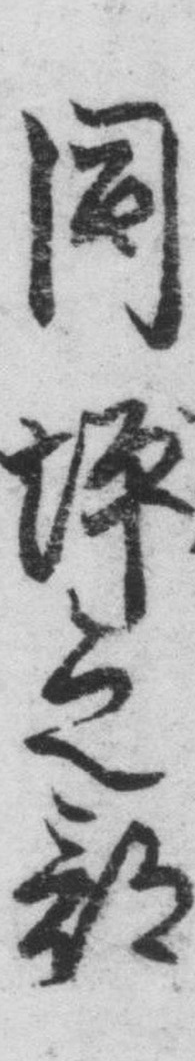同坪之部
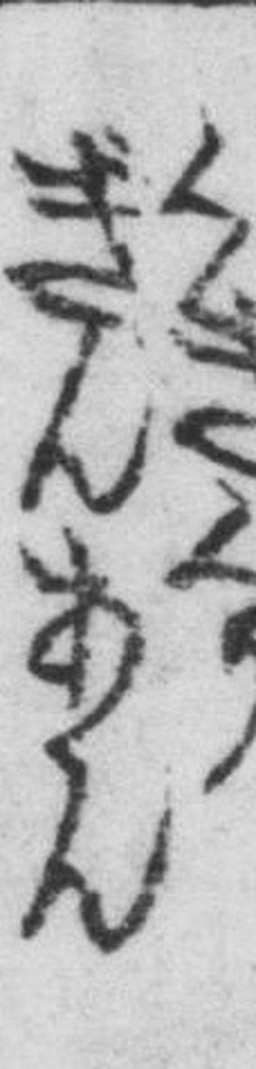ぎんあん
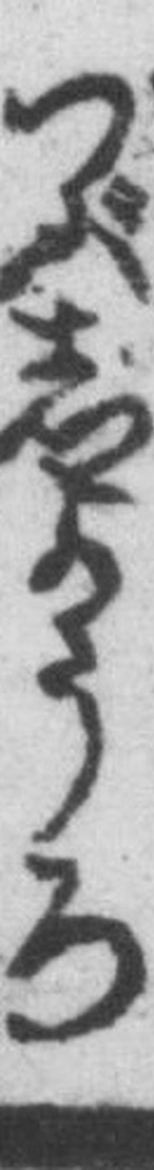つぶしようろ
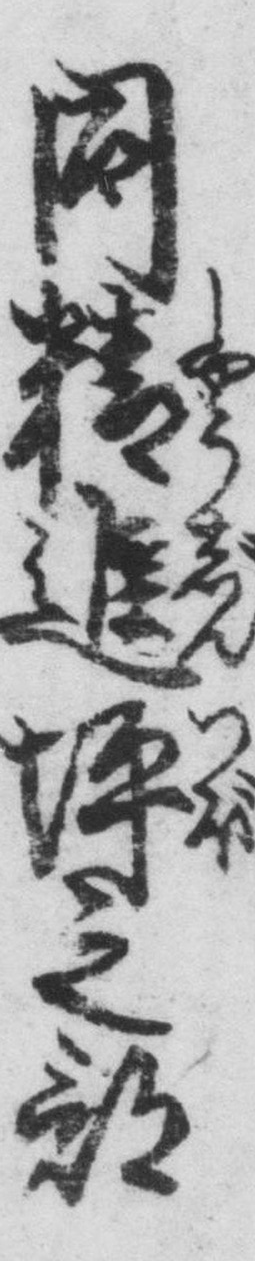同精進坪之部
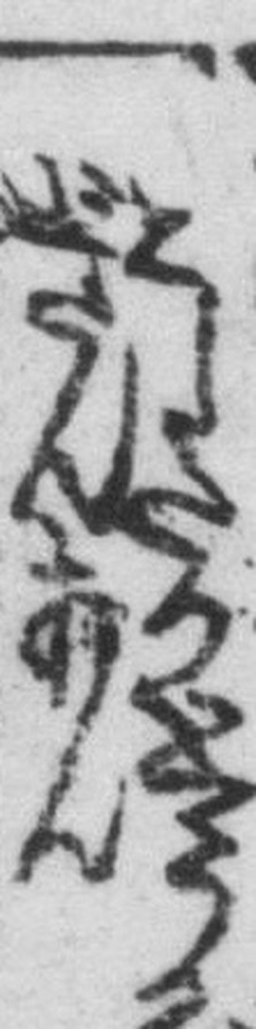ぎんあん
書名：即席庖丁
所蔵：大阪府立大学学術情報センター 国文学研究資料館
